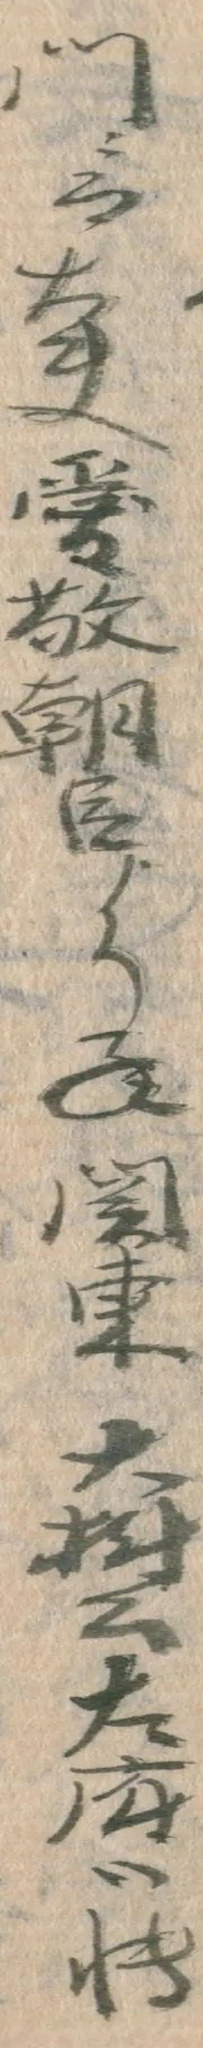門二而大夫愛敬朝臣より承関東大樹公左府御轉
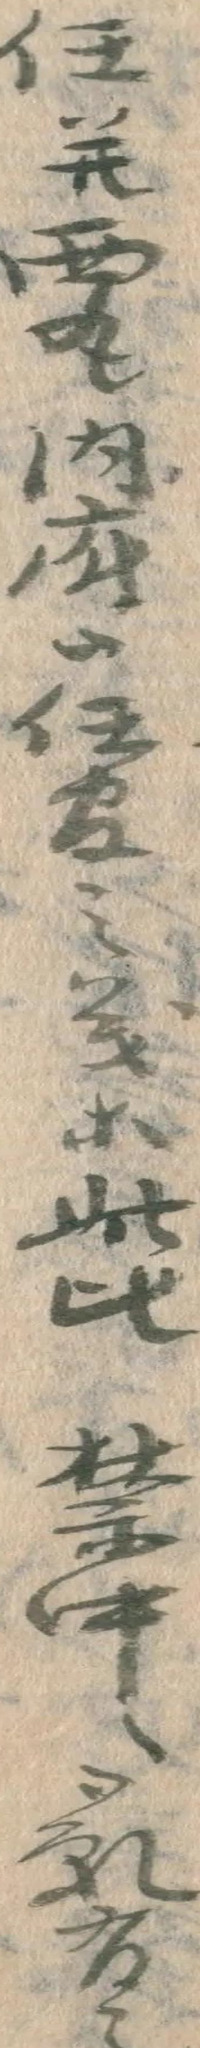住并西丸内府御任官之義等、此比禁中へ御願有之
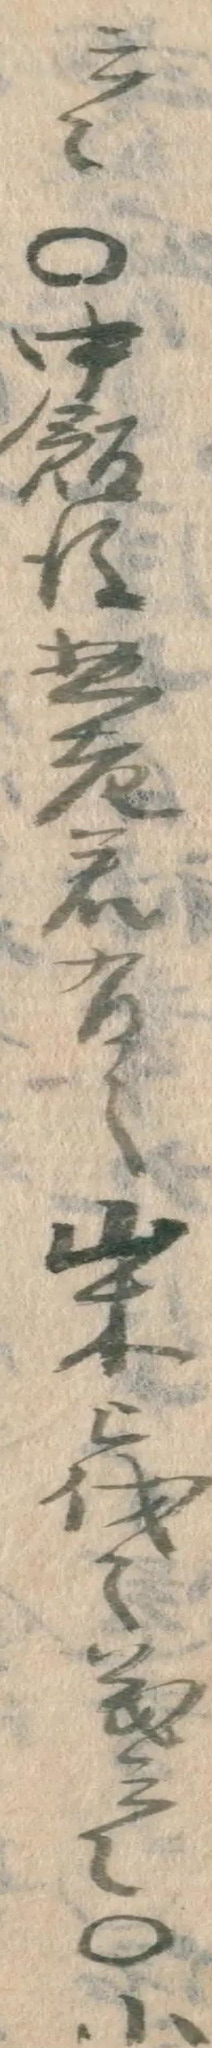云々○中飯後惣老若有之、山木被伐之義云〻、○小
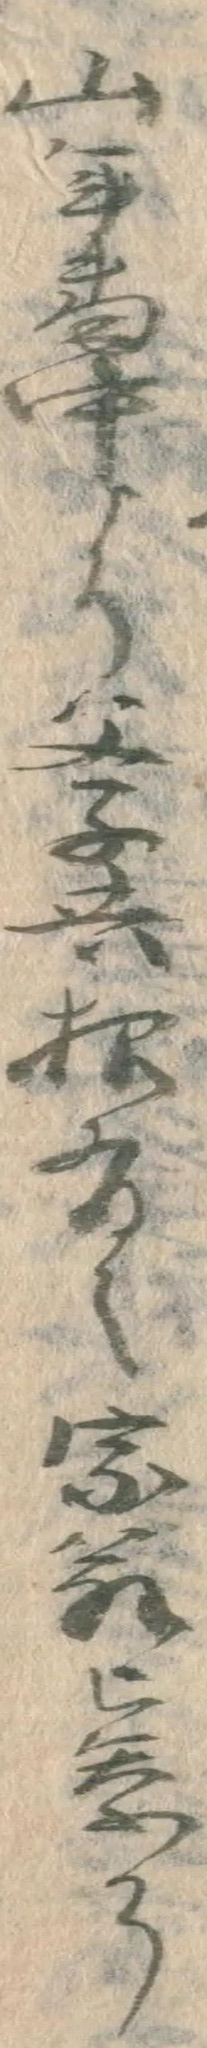山年番中より父子共様有之、家翁被参了、
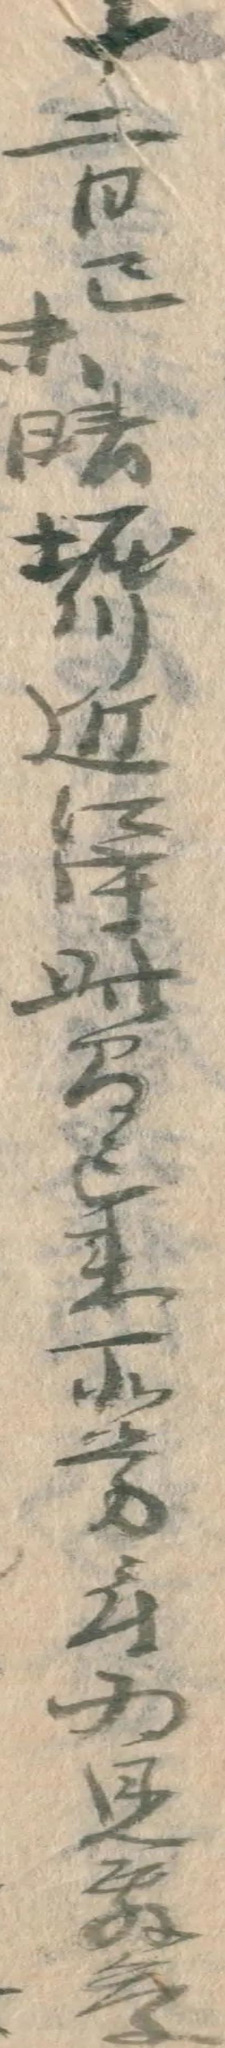十二日己未晴、堀川近江守此間被来、所労ニ付為見舞参、
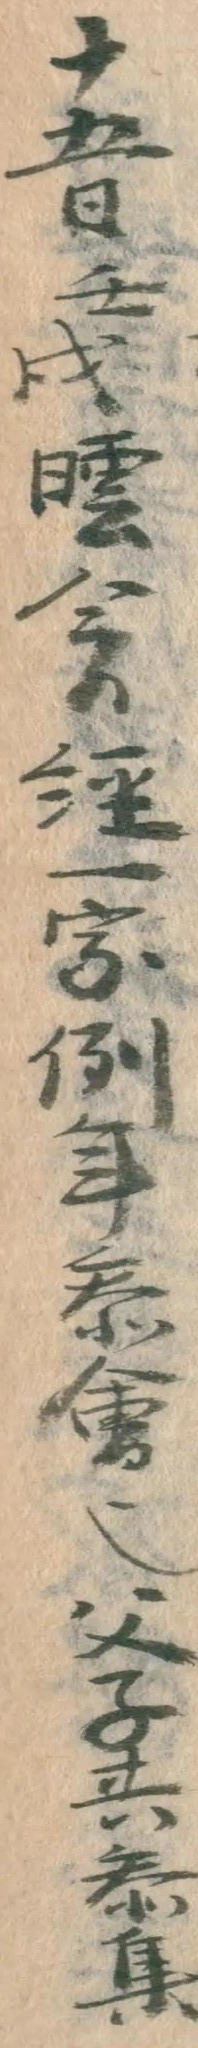十五日壬戌曇、今日経一家例年参會也、父子共参集、

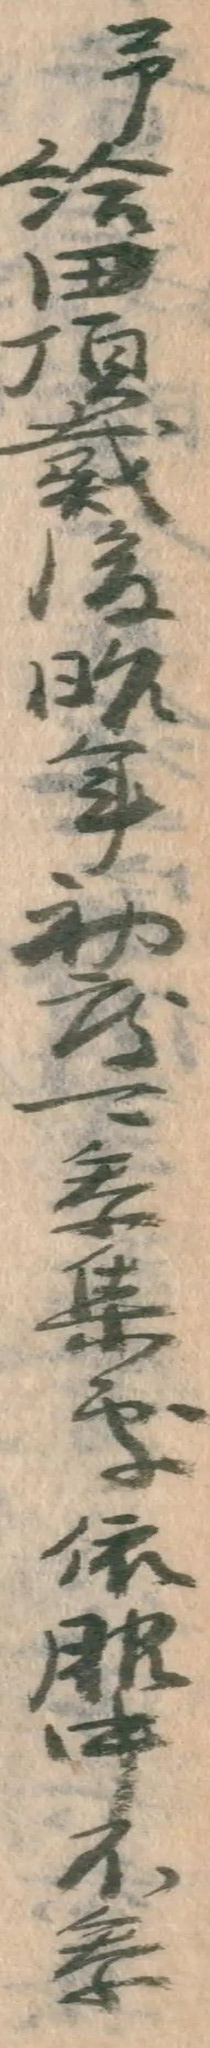予給田頂戴後、昨年初度可参集處、依服中不参、
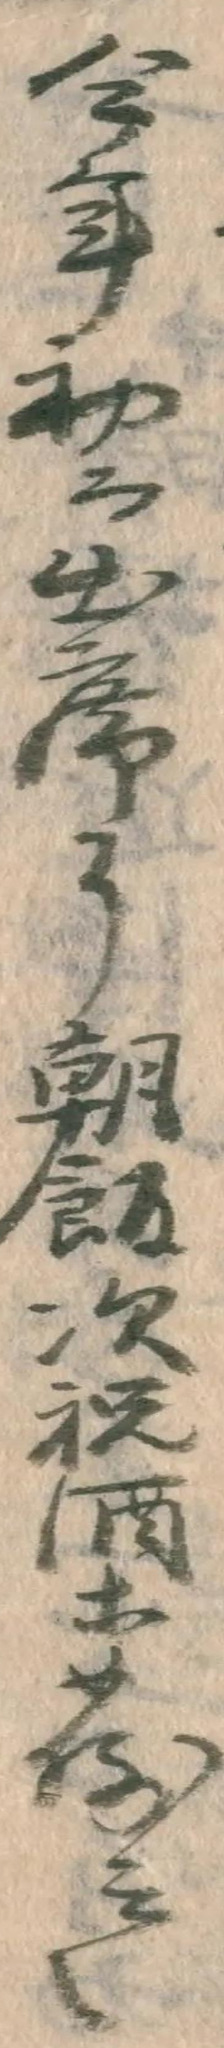今年初而出席了、朝飯次祝酒等如例云々、
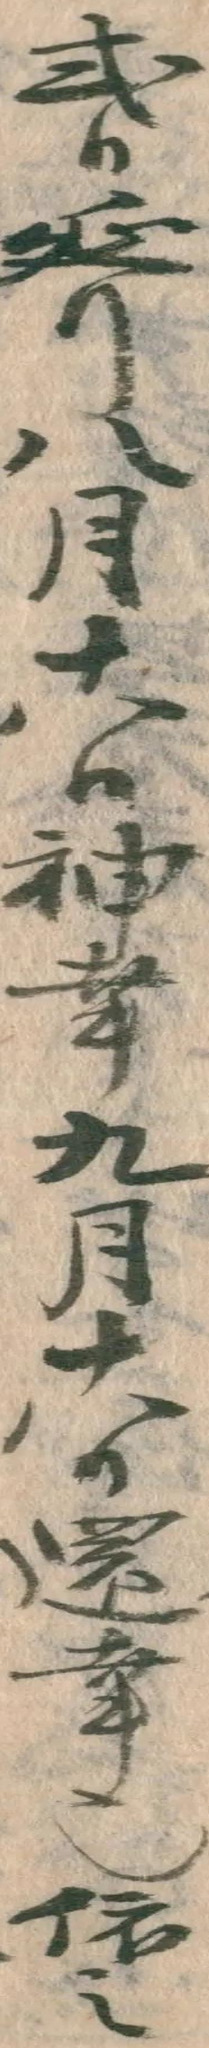式日延引、八月十八日神幸、九月十八日還幸也、依之
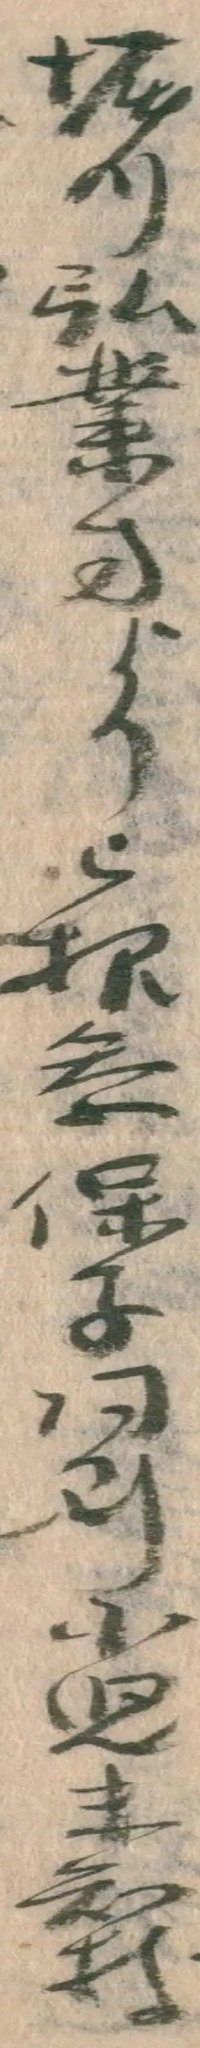堀川弘業方より被択参保子同断小児、未知披
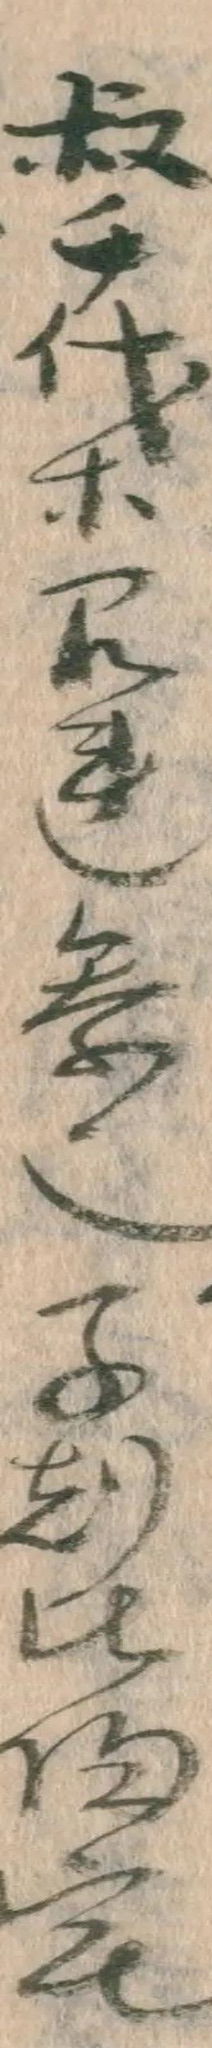叔千代等召連参也、子刻比帰宅、
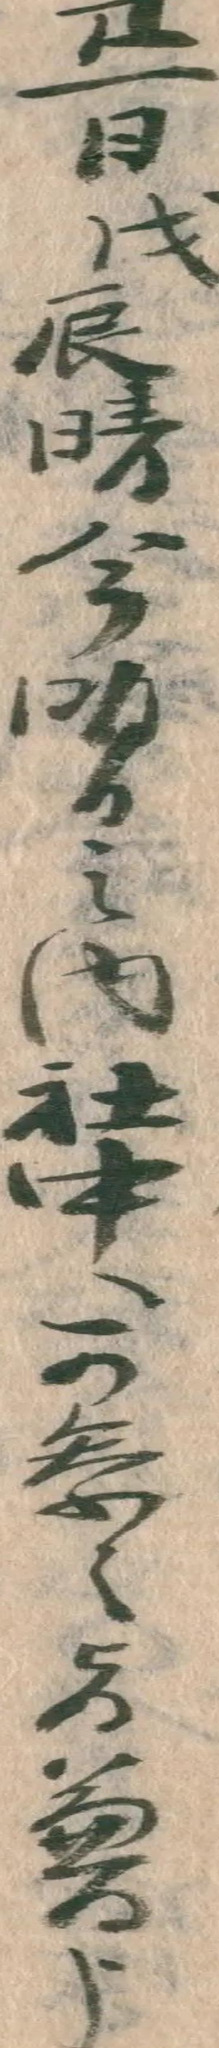廿一日戊辰晴、今明日之内社中へ可参之旨、兼而申
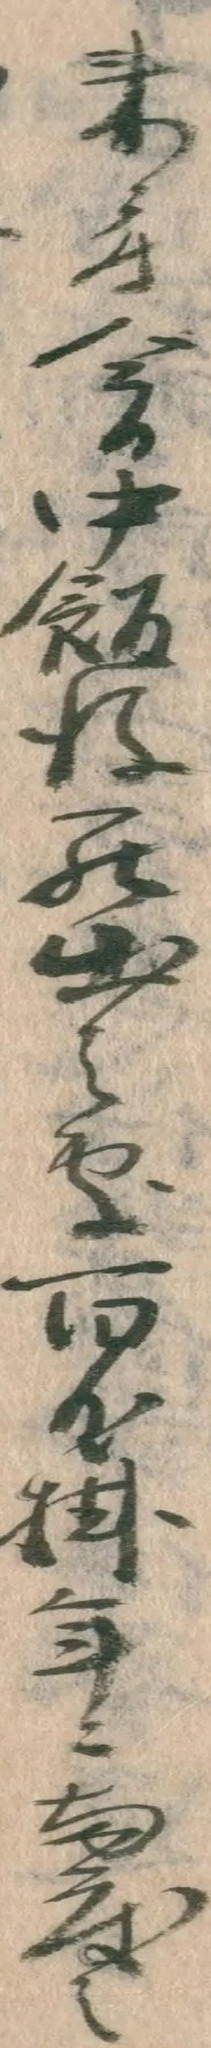来ニ付、今日中飯後罷出之處、百匁掛年に両度之
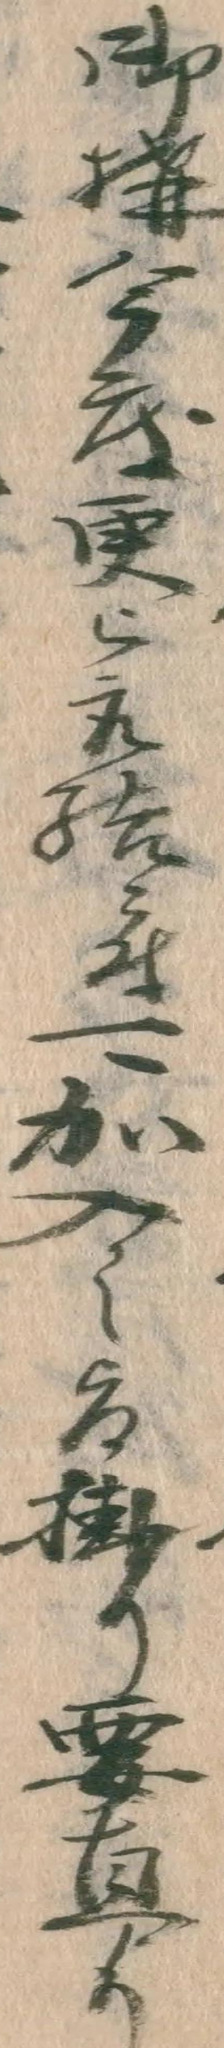御構、今度更被取詰ニ付可加入之旨、掛り要直より
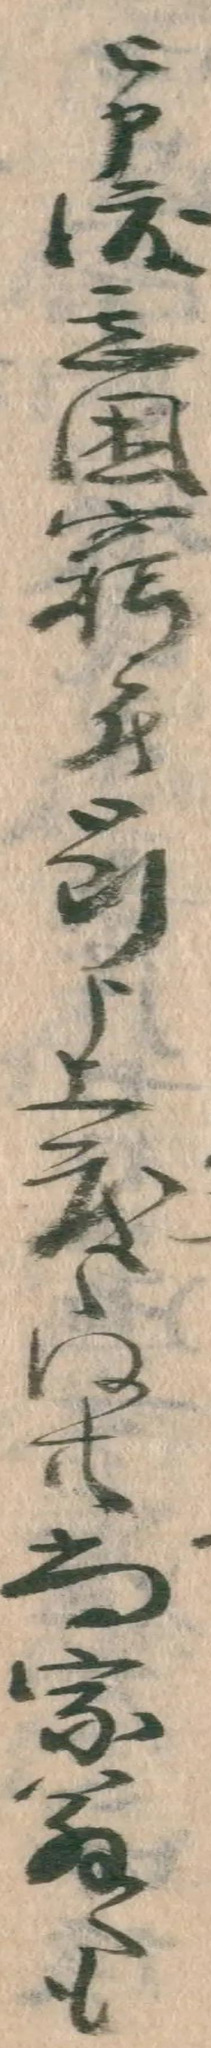被申渡、甚困窮ニ付御断申上度候得共、尚家翁へも
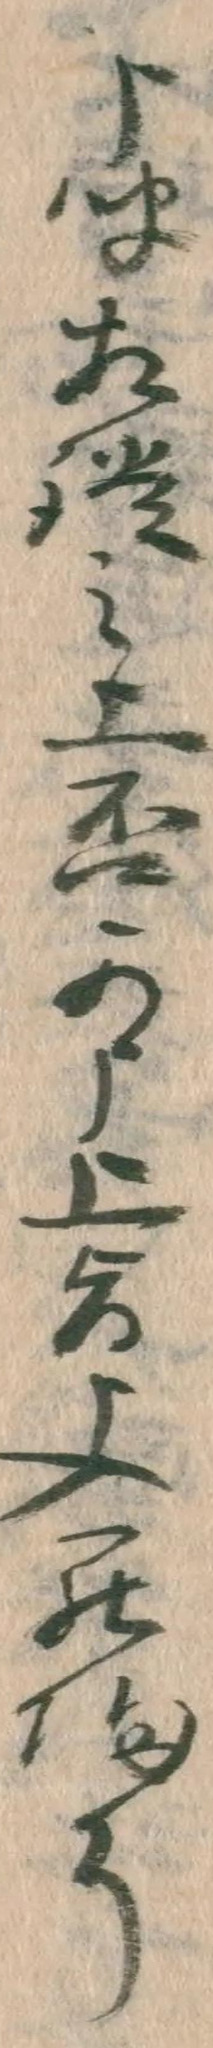申聞相談之上否可申上旨申入罷帰了、
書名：賀茂社記録. 第63冊
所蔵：国立国会図書館 National Diet Library, JAPAN
